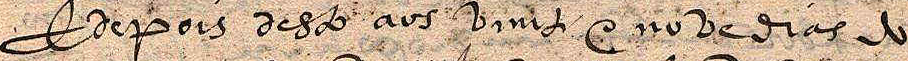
E despois desto aos vimte e nove dias do
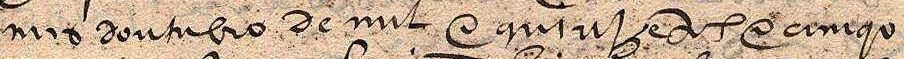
mes doutubro de mil e quinhētos e cimqo
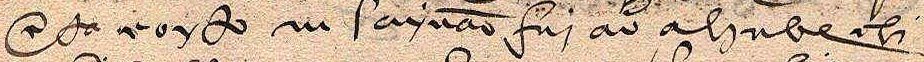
ēta e oyto eu scryuão fuj ao aljube e li
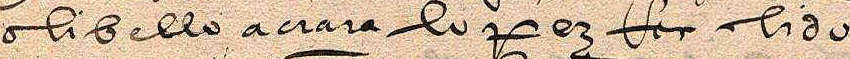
o libello a crara lopez Ree e lido
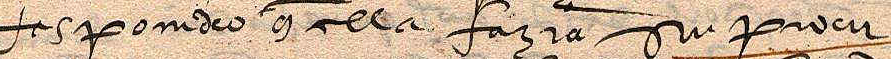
Respomdeo q̄ ella fazia seu procu
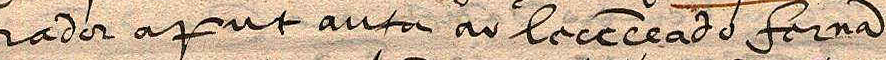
rador aput auta ao leçēçeado fernā
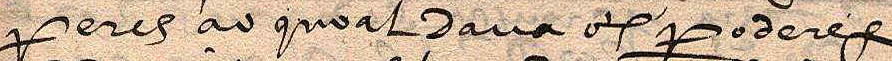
peres ao quoaL daua os poderes
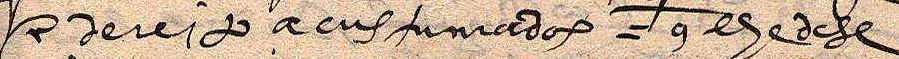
ē derejto acustumados e q̄ lhe dese
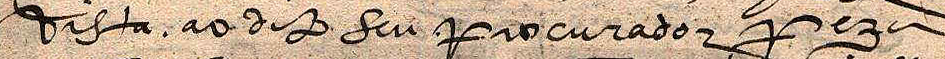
vista ao dito seu procurador pera
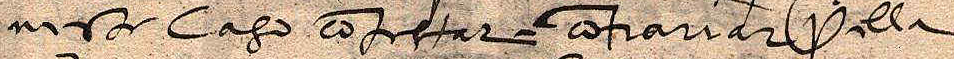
neste Caso c̄otestar e c̄otrariar p̄o ella
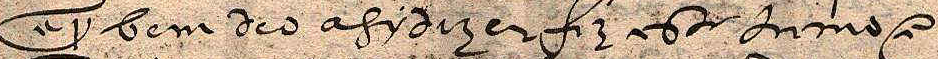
e p̄o bem de o asy dizer fiz este termo ē
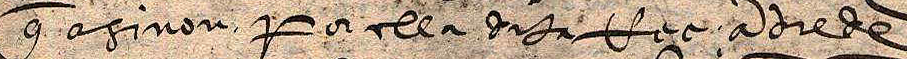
q̄ asinou por ella dita Ree ādre de
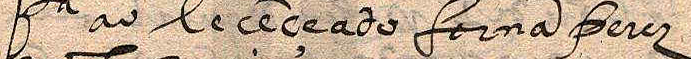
Vta ao leçēçeado fernā perez
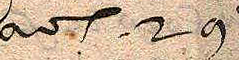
aos 29
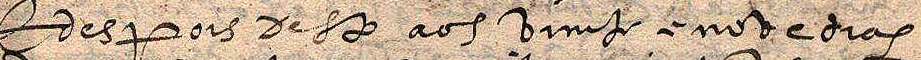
E despois desto aos vimte e nove dias
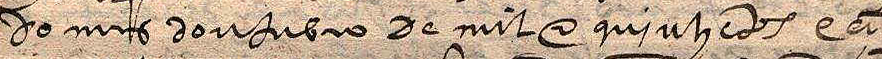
do mes doutubro de mil e qujnhētos e çī
